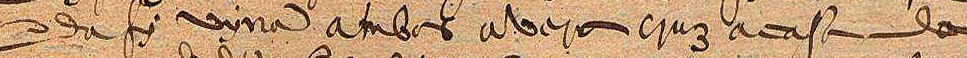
e dahy vyera̅ ambos a vera cruz a casa da
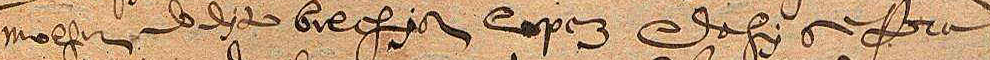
molher do dyto belchyor lopez e dahy se fora̅
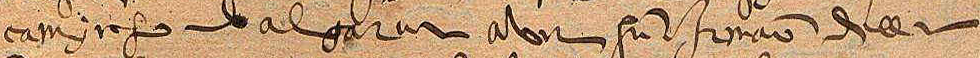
camynho do algarue a ver hu̅ Jrmaõ delle
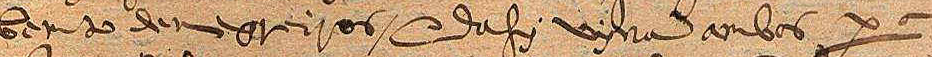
bemto de negreiros / e dahy vyera̅ ambos ꝑa
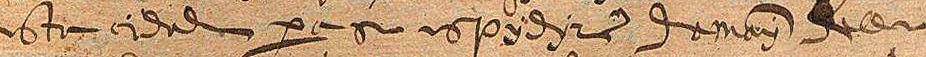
esta cidade ꝑa se espydyre̅ da ma̅y delle
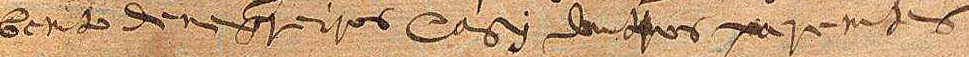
bemto de negreiros e asy doutros paremtes
